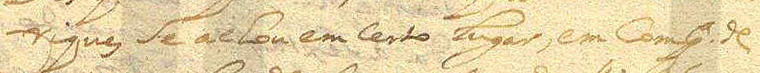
riques se achou em certo lugar, em Comp.a de
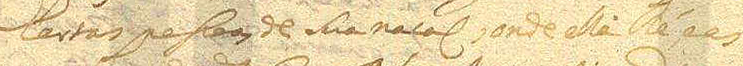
certas pessoas de sua naçā, onde ella Ré, e as
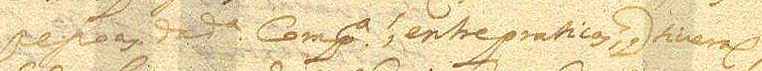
pessoas da d.a Comp.a, entre praticas, q̄ tiuerā
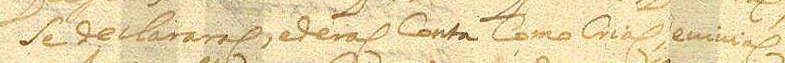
se declararā, e derā Conta Como Criā, e uiuiā
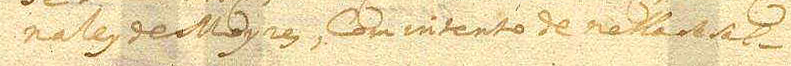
na ley de Moyzes, Com intento de nella se sal
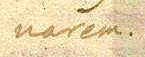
uarem.
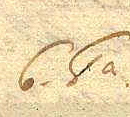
6.Ta
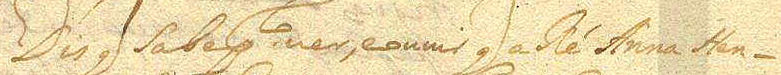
Dis q̄ sabe p.lo uer, e ouuir q̄ a Ré Anna Hen
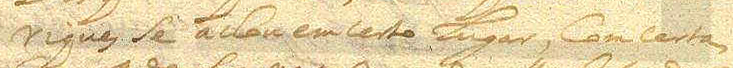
riques se achou em certo Lugar, Com certa
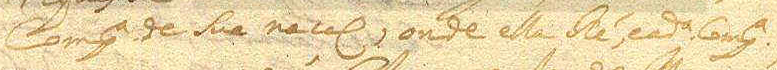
Comp de sua naçā, onde ella Ré, e a d.a Comp.a
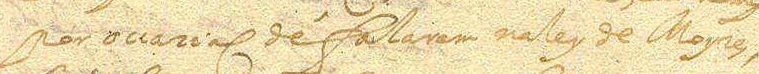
por occaziā de falarem na ley de Moyzes,
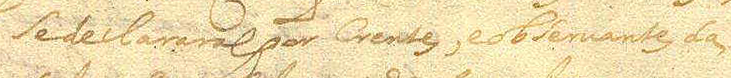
se declararā por Crentes, e obseruantes da
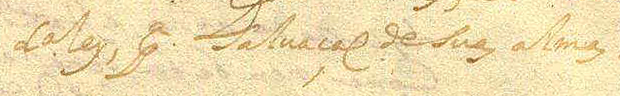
da ley, p.a saluaçā de suas almas
